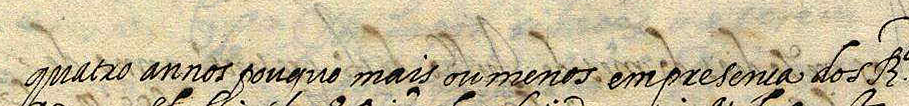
quatro annos pouquo mais ou menos em presença dos Rdos
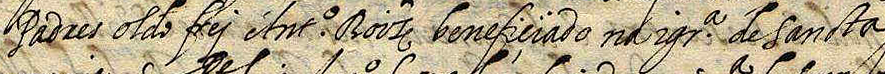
Padres o ldo frej Ant.o Roiz beneficiado na igr.a de Sancta
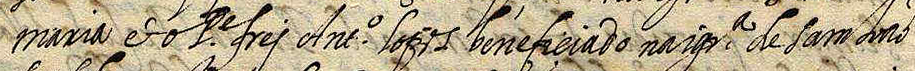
maria, e o P.e frej Ant.o lopes beneficiado na igr.a de sam Ioaō
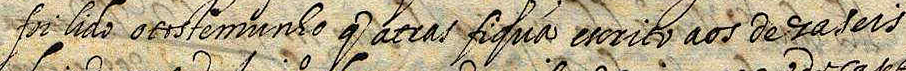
foi lido o testemunho q̄ atras fiqua escrito aos dezaseis
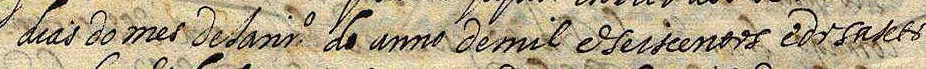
dias do mes de Janr.o do anno de mil e seiscentos e desaseis
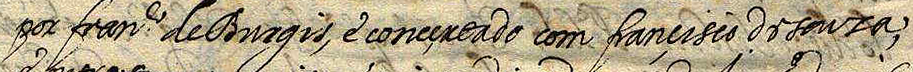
por fran.co de Burgis, e concertado com francisco de souza,
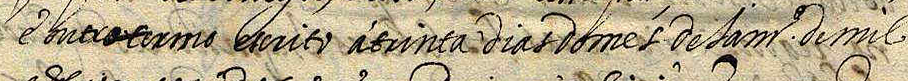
e outro termo escrito à trinta dias do mes de Janr.o de mil
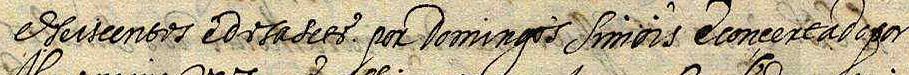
e seiscentos e desaseis. por Domingos Simois e concertado por
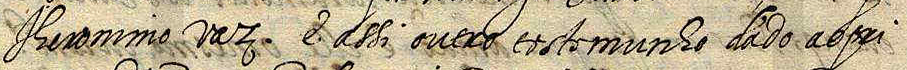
Jheronimo vaz. E assi outro testemunho dādo ao pri
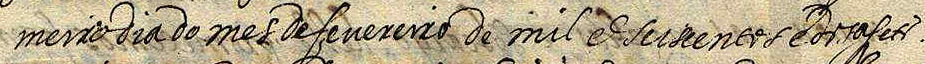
meiro dia do mes de feuereiro de mil e seiscentos e desaseis
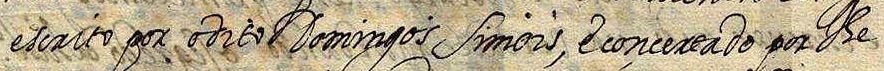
escrito por o dito Domingos Simois, e concertado por Jhe
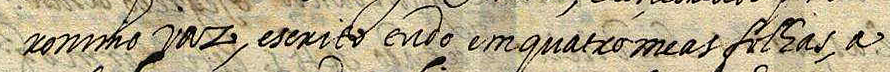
ronimo vaz, escrito tudo em quatro meas folhas, a
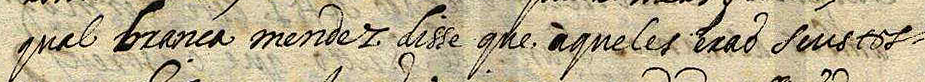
qual branca mendez disse que aqueles eraõ seus tes
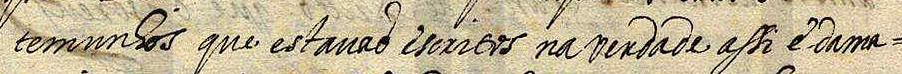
temunhos que estauaõ escritos na verdade assi e da ma
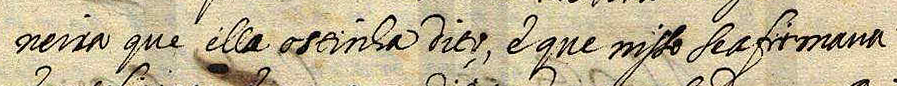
neira que ella os tinha dito, e que nisso se afirmaua
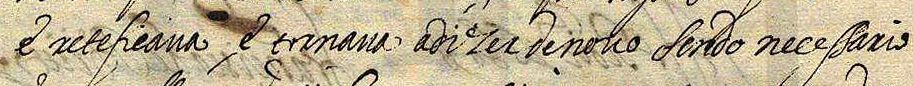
e reteficaua, e tornaua a dizer de nouo sendo necessario
